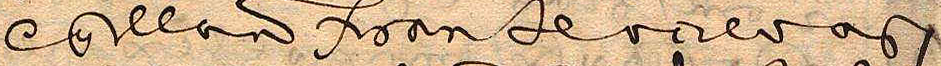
e q̄ ella cōfesante o creo asj
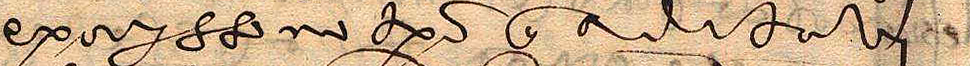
e por jsso no tpō q̄ a dita vj
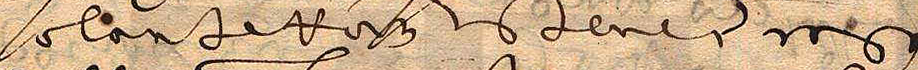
olante Rōiz esteue ē casa
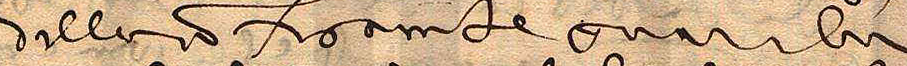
della cōfesamte guardou
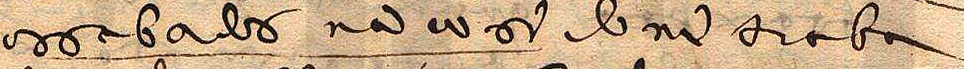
os sabados n̄ cosēdo nē traba
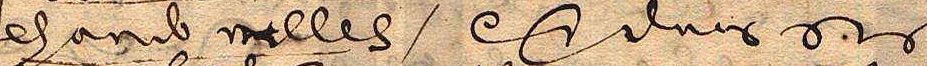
lhando nelles / e ē duas ses
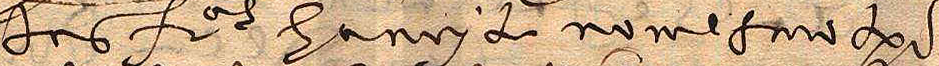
tas fras ha noyte no mesmo tpō
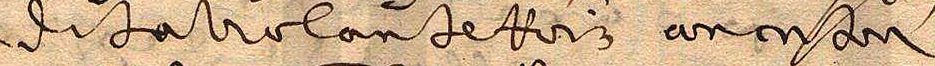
a dita violante Rōiz concertou
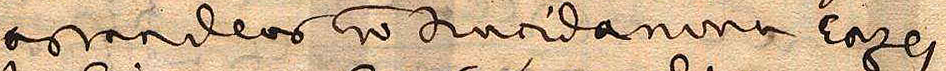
as candeas cō trocida nouas E azej
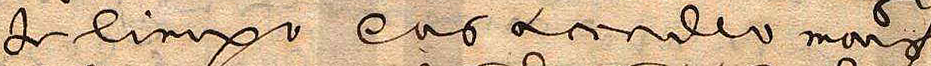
te limpo e as acendeo mais
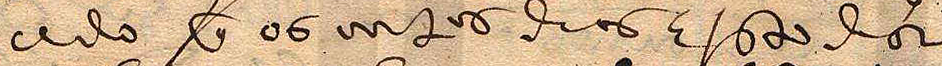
cedo q̄ os outos dias E jsto dise
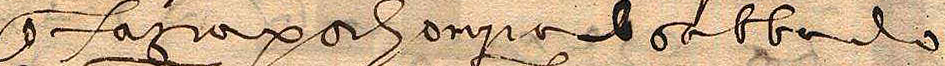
q̄ fazia por homrra do sabbado
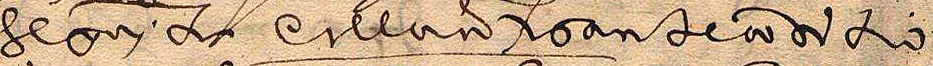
seguȳte e ella cōfesante cōsētio
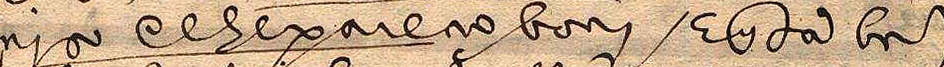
njso e lhe pareçeo bom / E q̄ tābē
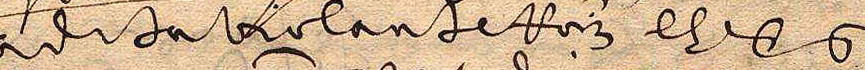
a dita violante Rōiz lhe ēsj
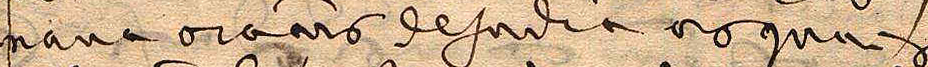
naua orações de judia as quaes
